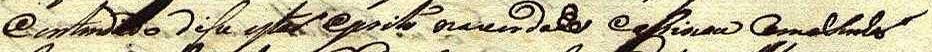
E entend_o disse estar escrito na verdade e assinou com o senhor
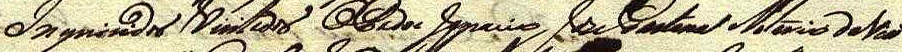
Inquisidor Visitador O Padre Jgnacio Joze Pastana Notario da Vara
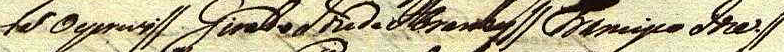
e o escrevi// Giraldo Joze de Abrantes// Francisco Joze.//
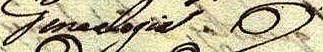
Genoelogia
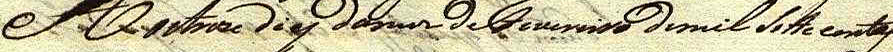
Aos treze dias do mez de Fevereiro de mil settecentos
